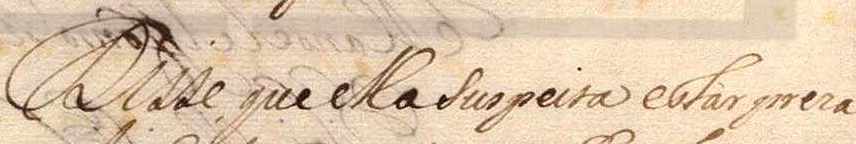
Disse, que ella suspeita estar preza
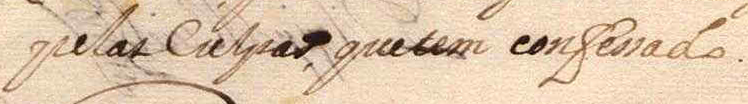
pelas Culpas, que tem confessado.
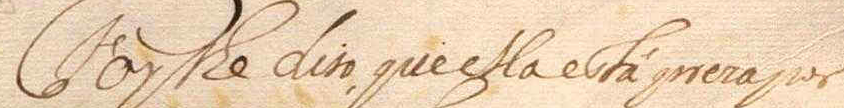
Foylhe dito, que ella está preza por
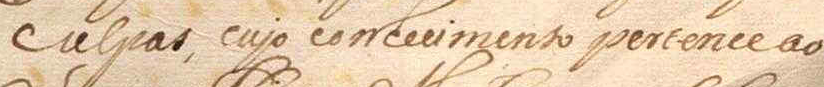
Culpas, cujo conhecimento pertence ao
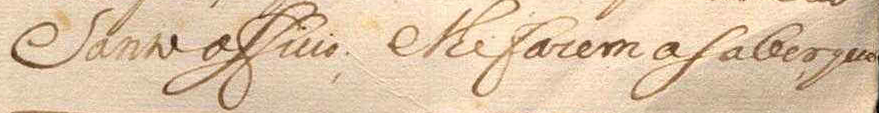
Santo officio, e lhe fazem a saber, que
